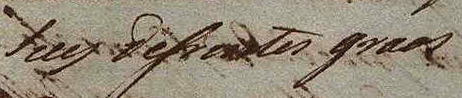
seus defrentes graos
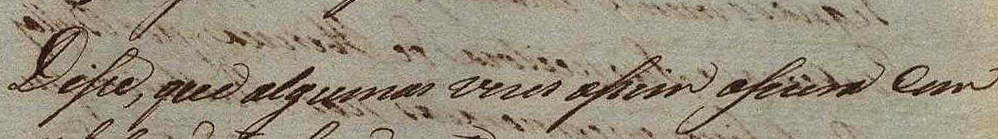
Disse, que algumas vezes assim o fizera com
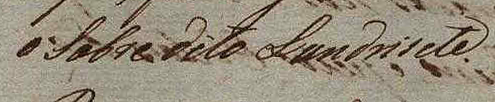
o sobredito Lundrisete.
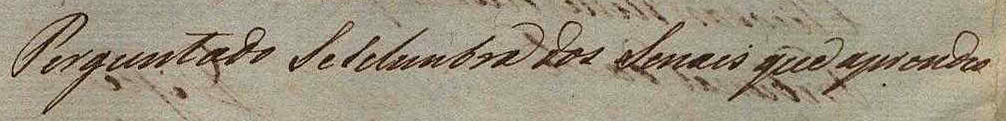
Perguntado Se se lembra dos Senais que aprendeo
